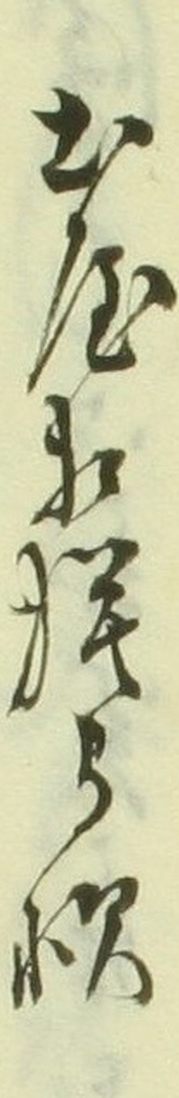土屋相模守様
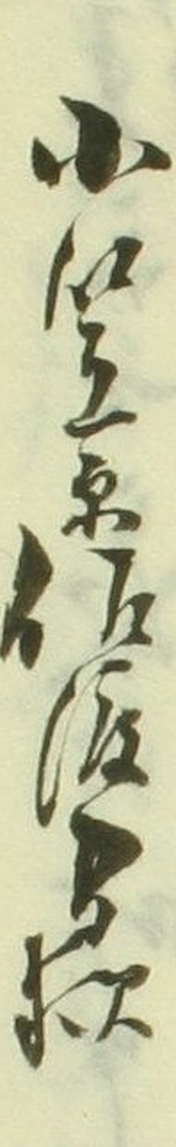小笠原佐渡守様
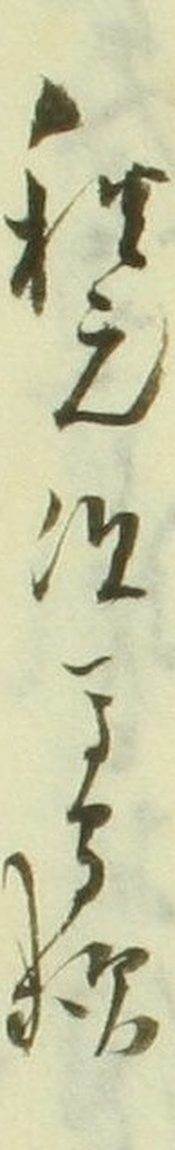秋元但馬守様
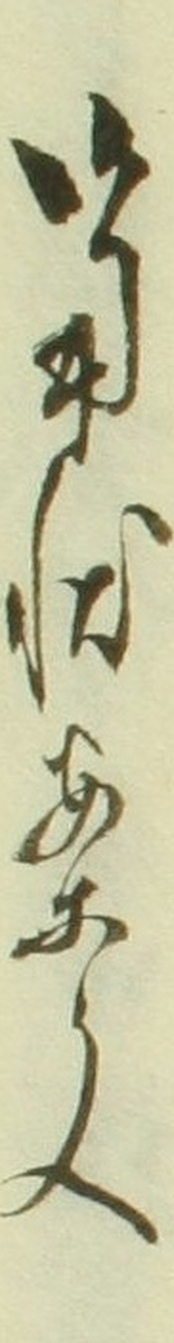御用状案文
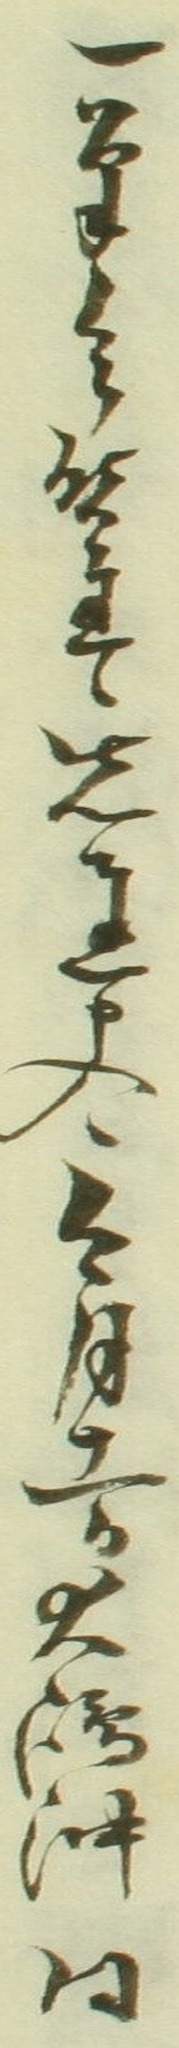一筆令啓達候先達申入候今月十一日大嶋沖同
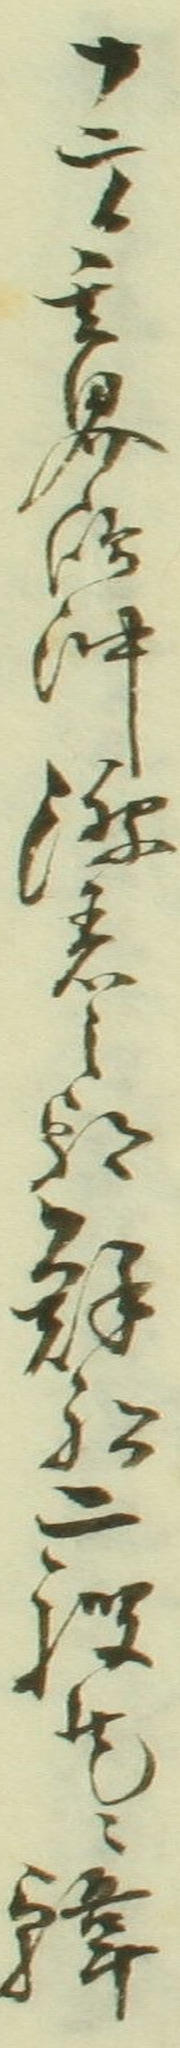十二日玄海嶋沖漂着之朝鮮船二艘共ニ韓
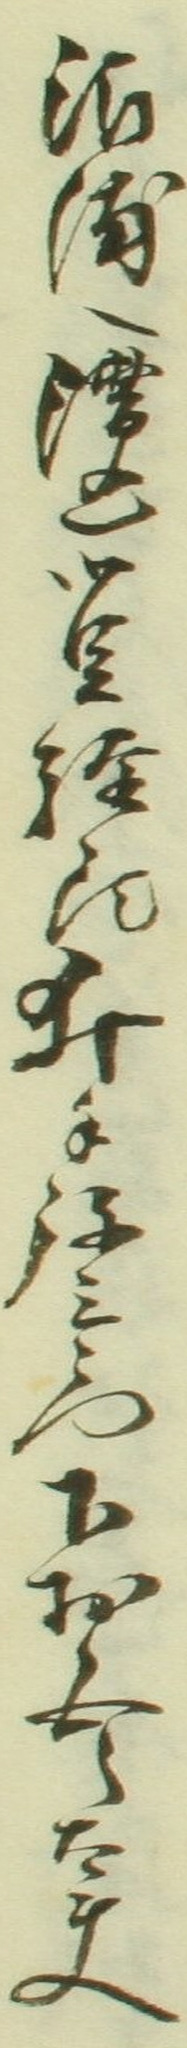泊浦へ漕込御足軽頭井手弥三右衛門下村五郎太夫
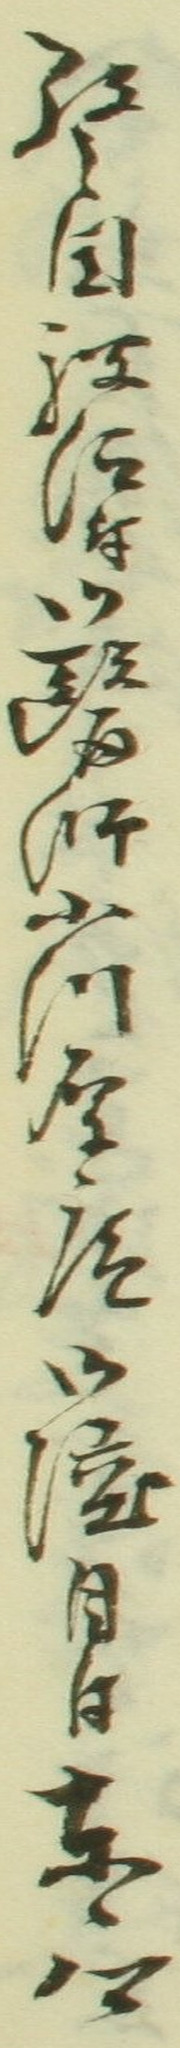警固被仰付御医師小川厚庵御陸目付東郷

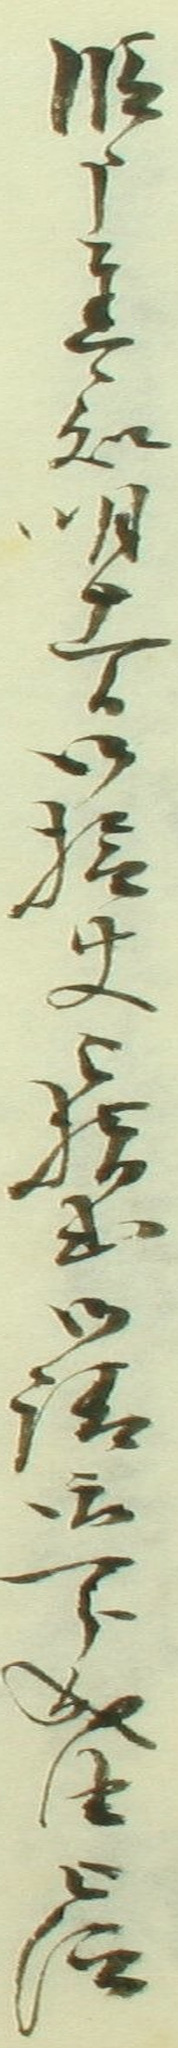段申達候処明十一日御検使被指出御請取可被成由被仰
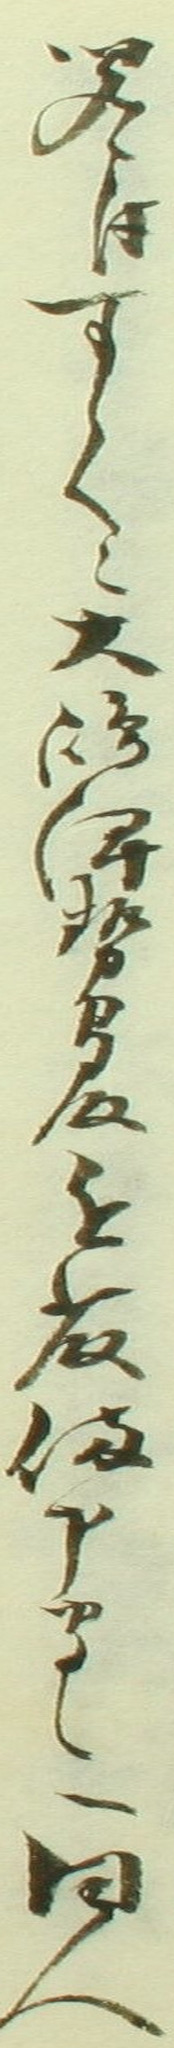聞候付すくに大嶋伊勢守殿近藤備中守へ同人
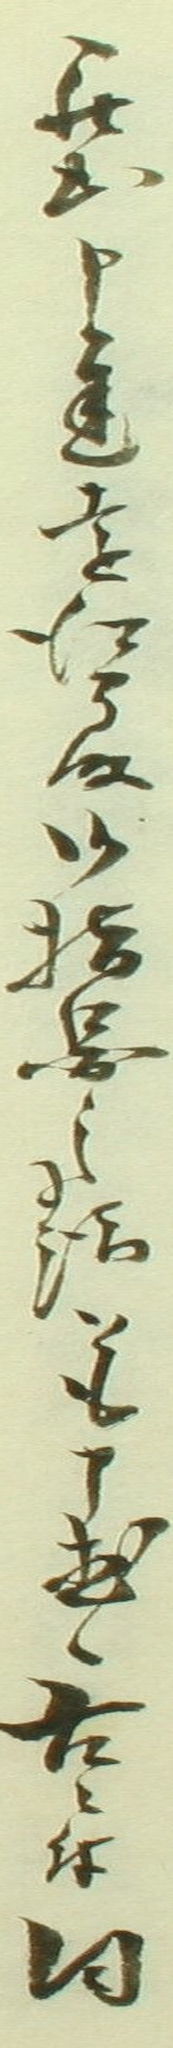罷出申達遠江守殿御指図之趣とも申置候右ニ付同
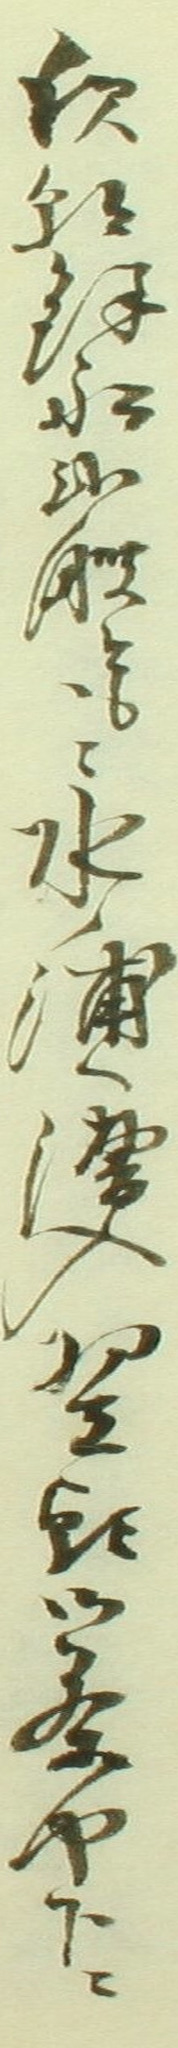様朝鮮船弐艘ともニ水ノ浦へ漕入翌朝御条中下ニ
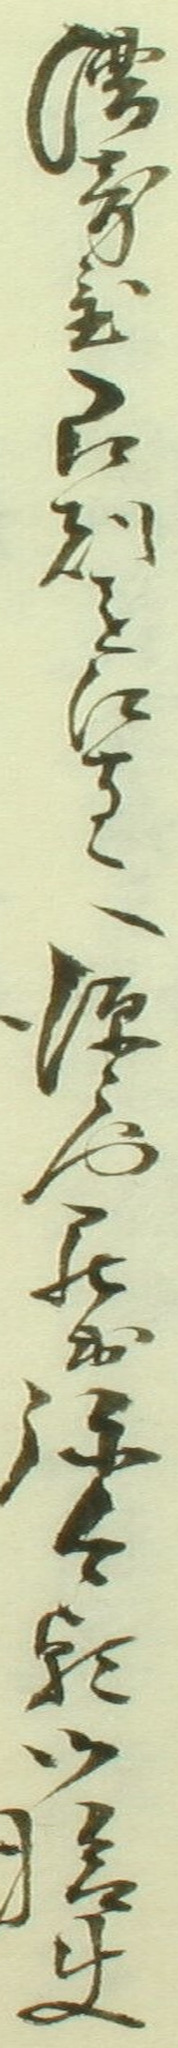漕寄置即刻遠江守へ源右衛門罷出弥今朝御検使
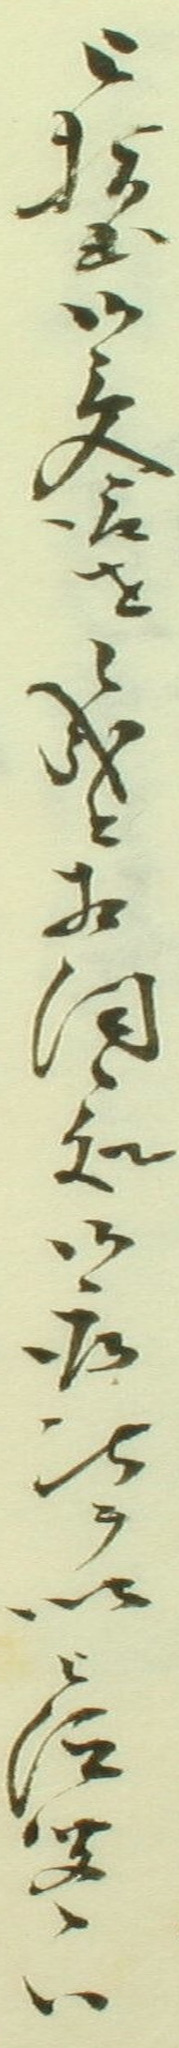被指出御受取せ候哉と相伺候処御取次ヲ以被仰聞候ハ
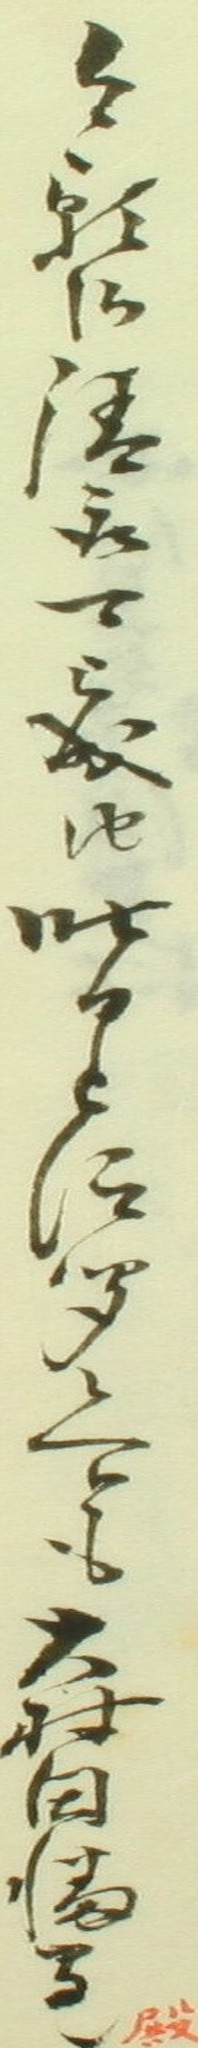今朝御請取可被成由昨日被仰聞候へとも大村因幡守殿
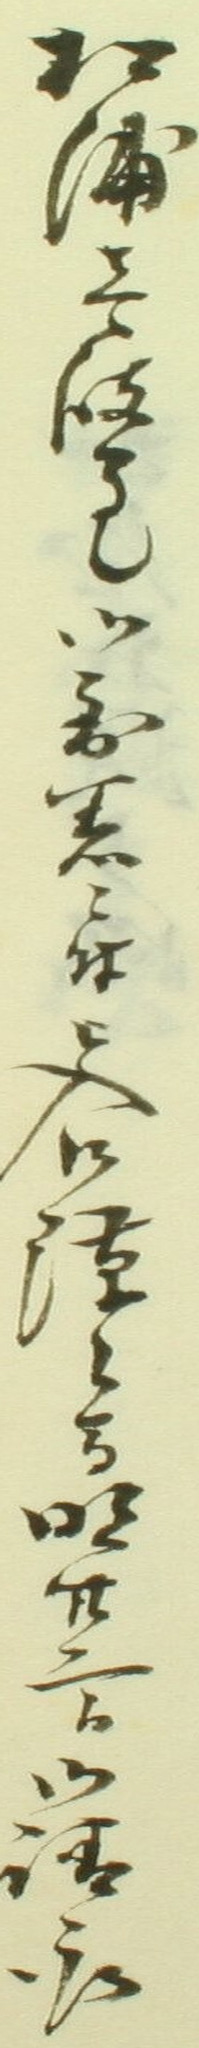松浦壱岐守殿御到着ニ付被入御障候間明廿二日御請取
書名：異国船漂着記
